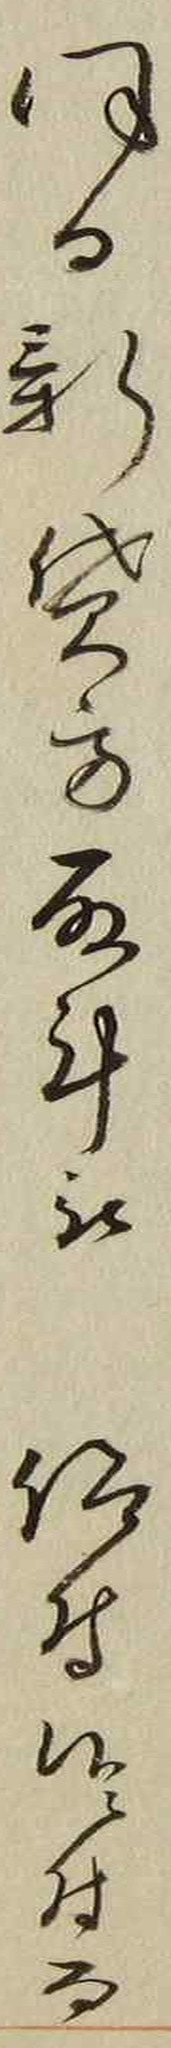同日新貸方取計被仰付候に付而
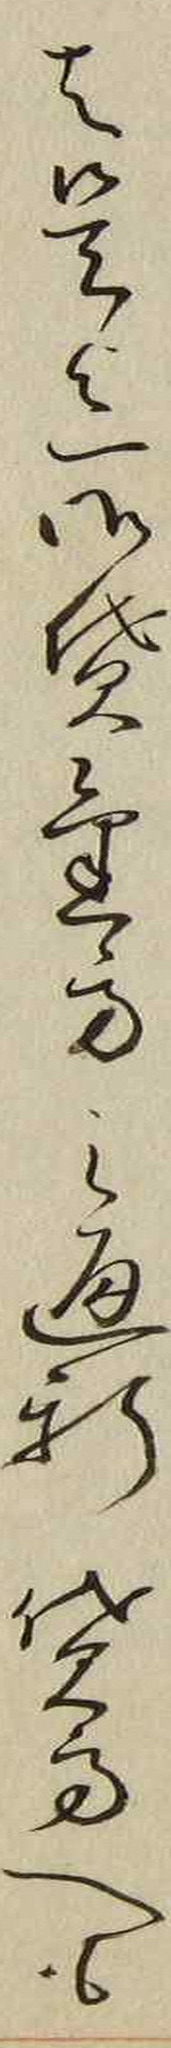は是迄御貸金方之通新貸方へも
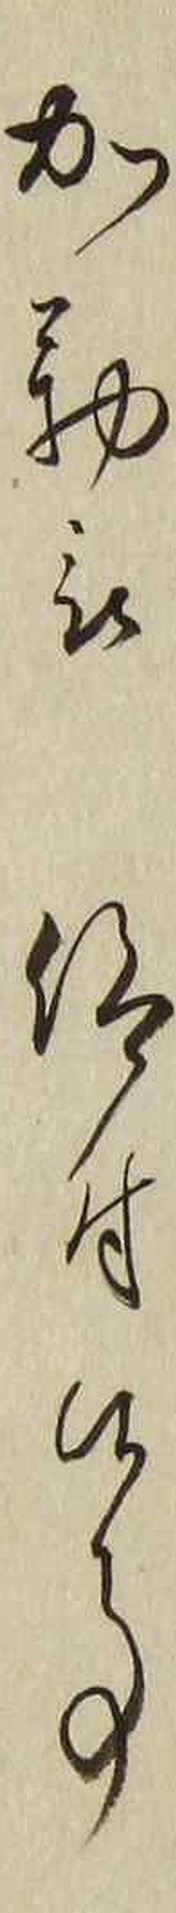加勤被仰付候事

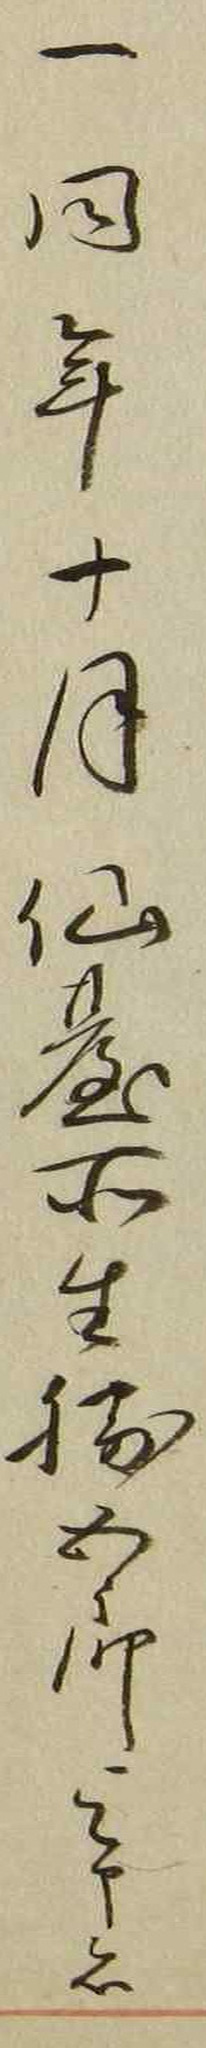一同年十月仙台所生勝五郎と申者
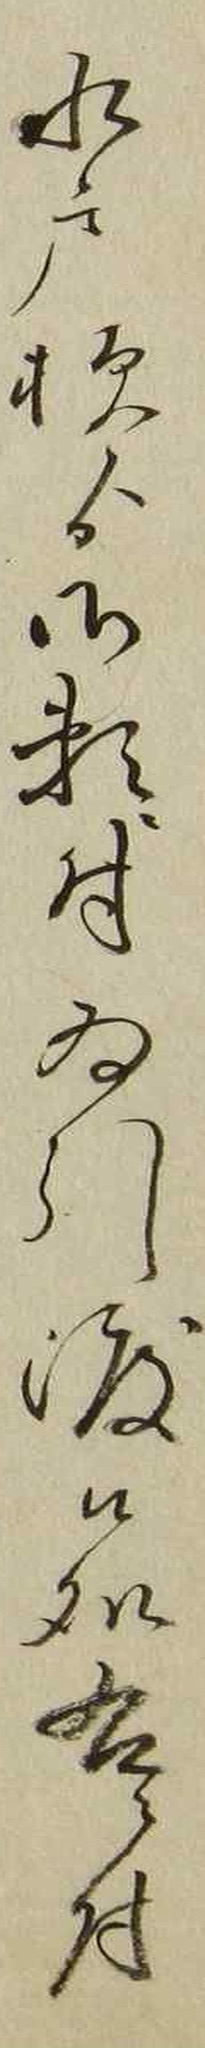水戸様ゟ御頼に付為引渡候処右に付
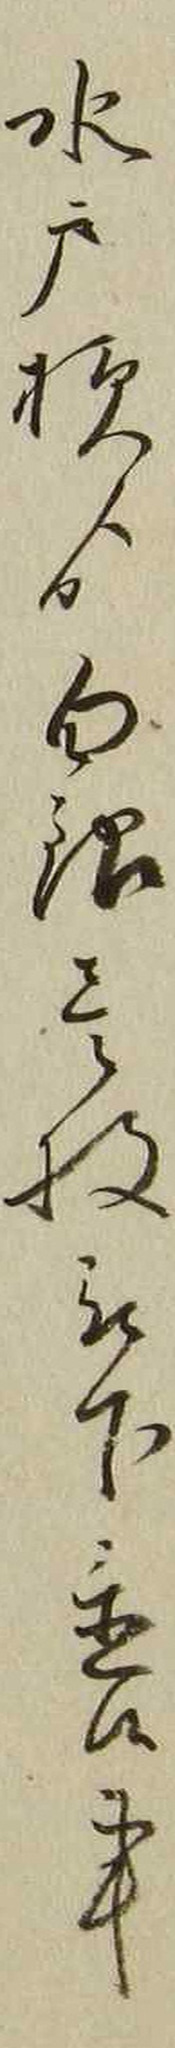水戸様ゟ白銀壱枚被下置候事
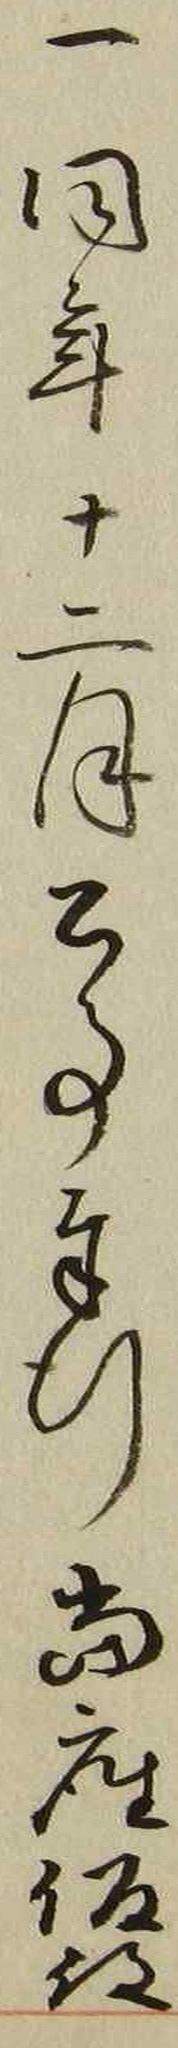一同年十二月公事奉行当座仮役
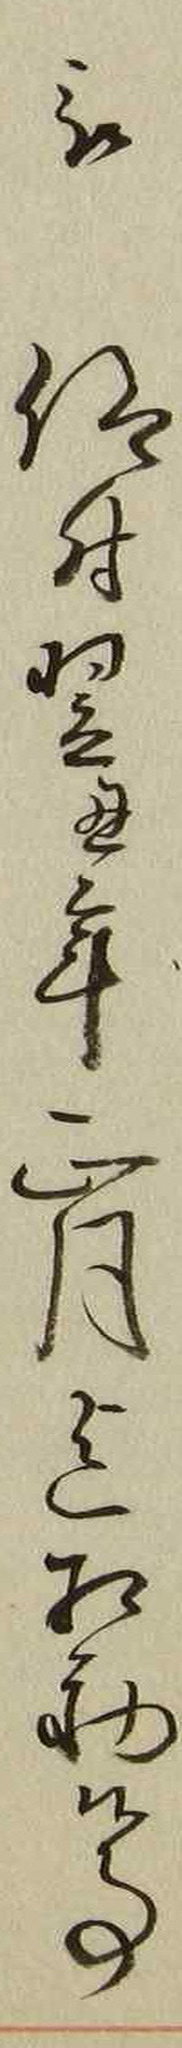被仰付翌丑年正月迄相勤候事
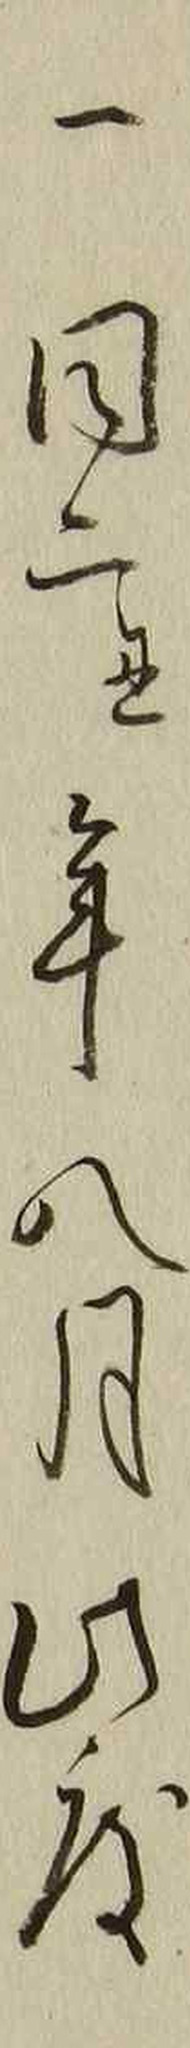一同二丑年八月此度
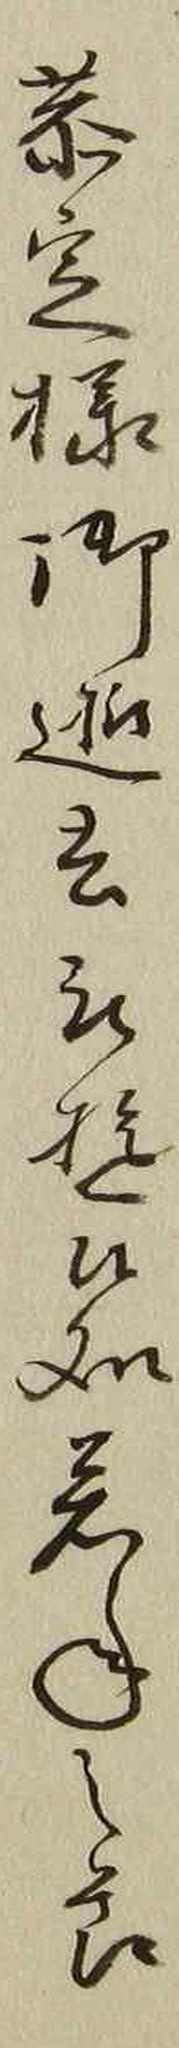恭定様御逝去被遊候処若年之節
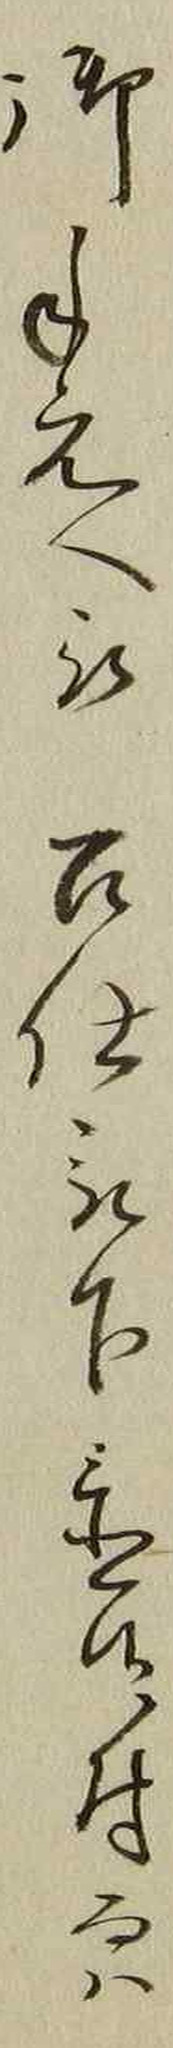御手元へ被召仕被下置候に付而ハ
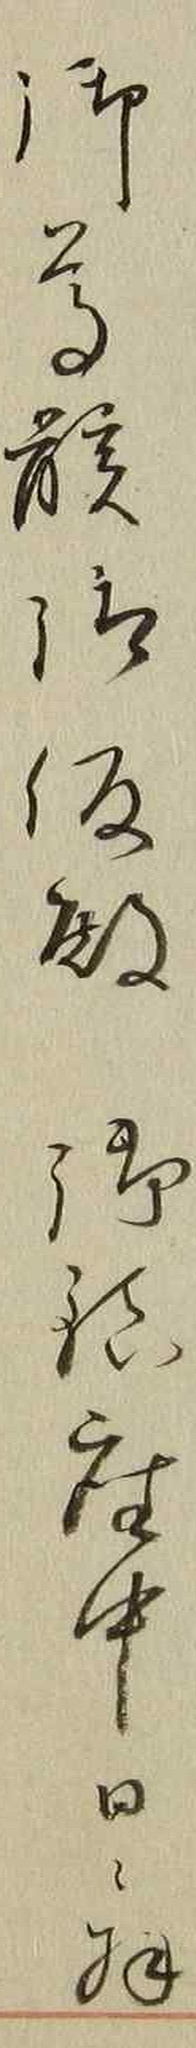御尊骸御仮殿御鎮座中日々拝
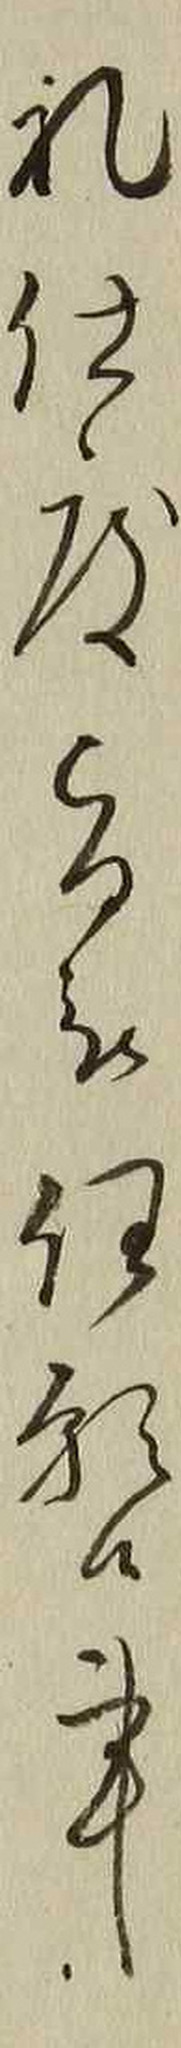礼仕度旨被任願候事
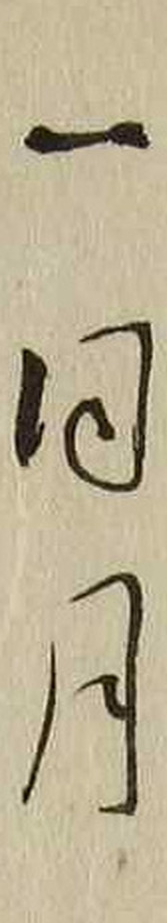一同月
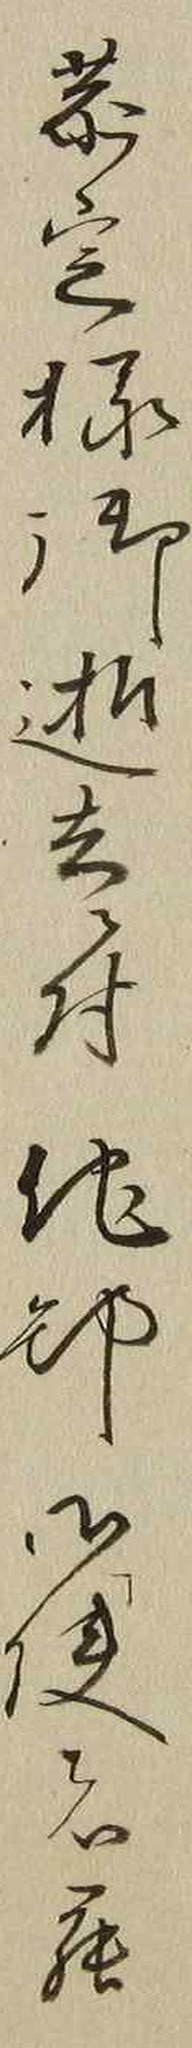恭定様御逝去に付他邨御使者罷
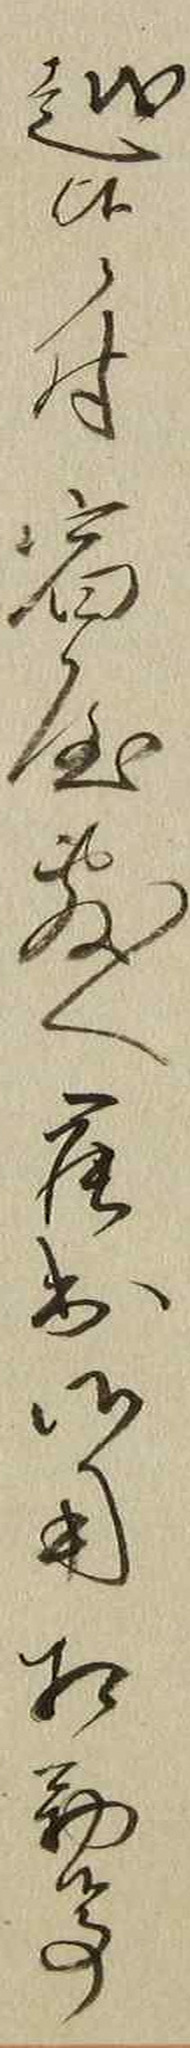越候に付宿屋敷へ罷出御用相勤候事
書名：諸士系譜　巻之3　い之部3
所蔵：会津若松市立会津図書館
